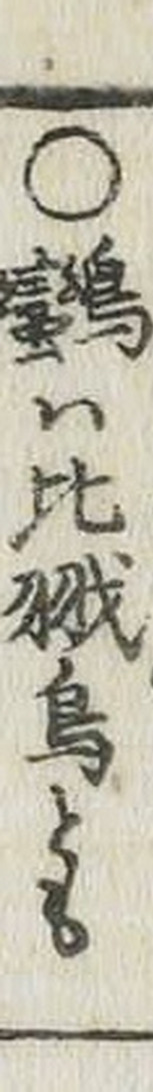○𪈿は比翼鳥とも
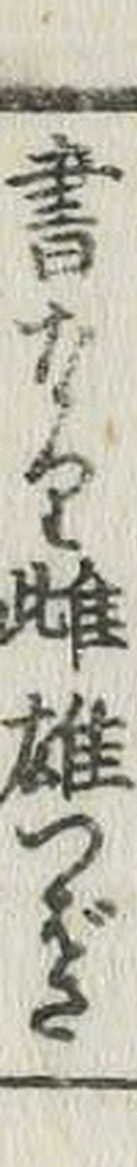書なり雌雄つばさ
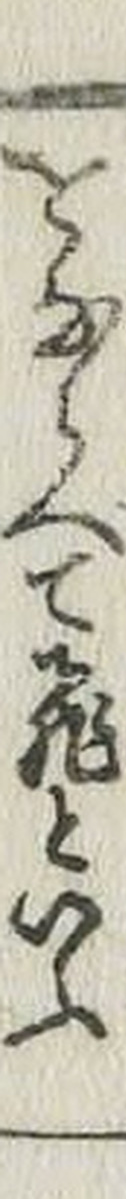をならべて飛といふ
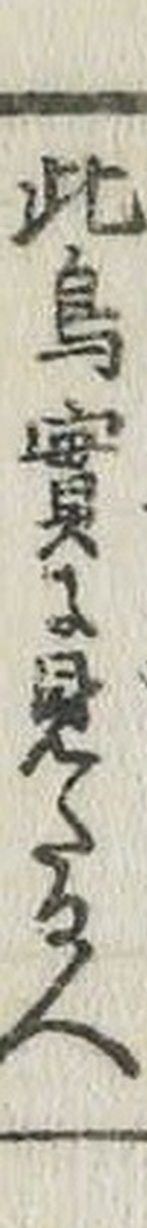此鳥実に見たる人
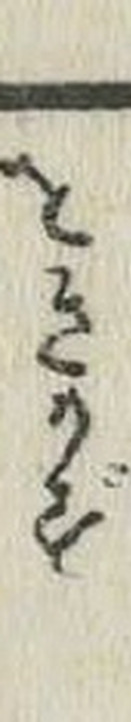をきかず

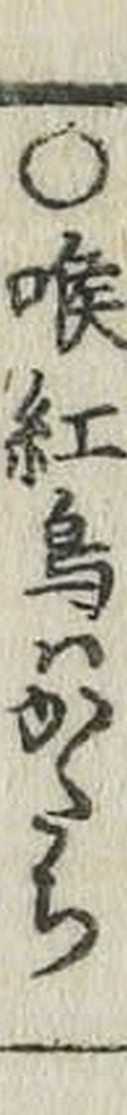○喉紅鳥はかたち
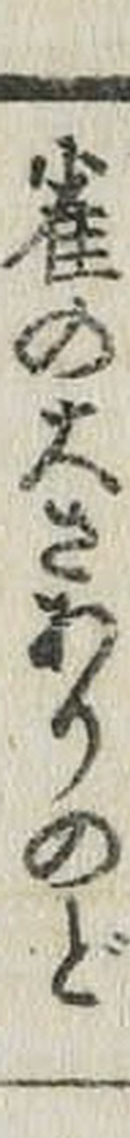雀の大さありのど
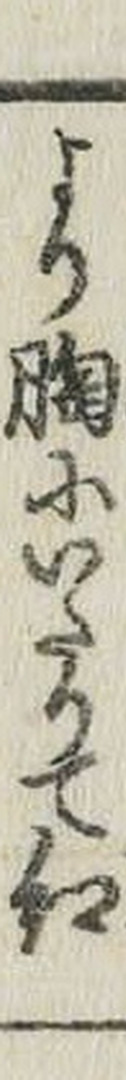より胸にいたりて紅
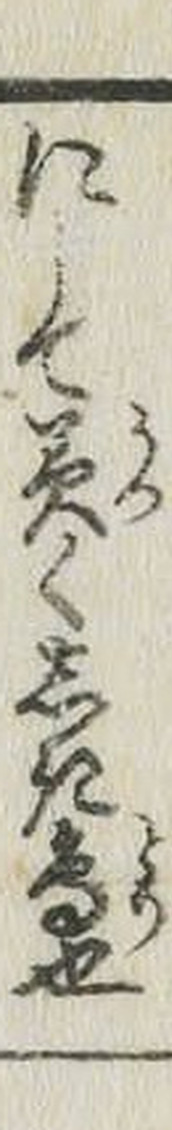にして美くしき鳥也
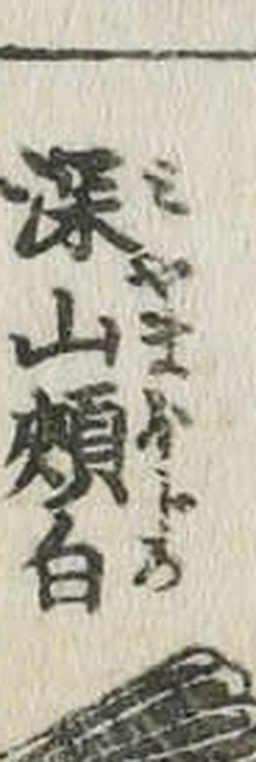深山頬白
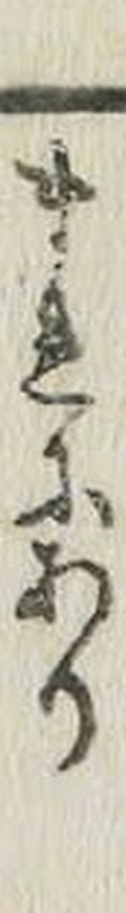まれにあり
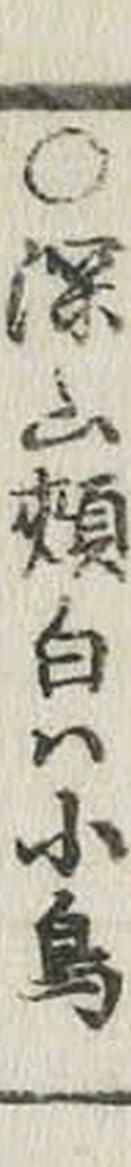○深山頬白は小鳥
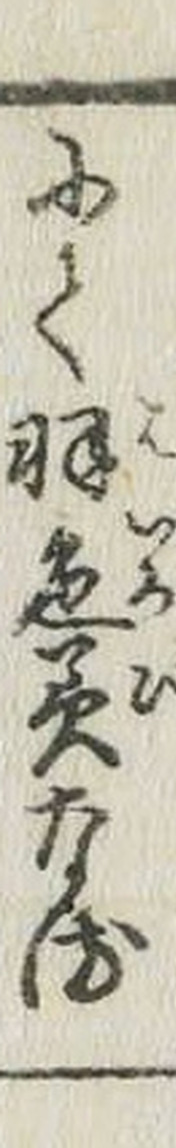にて羽色美なる
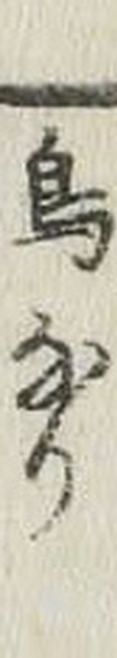鳥なり
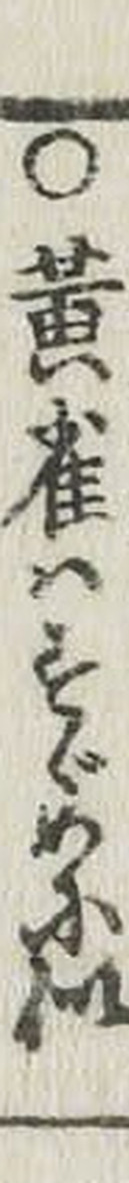○黄雀はすゞめに似
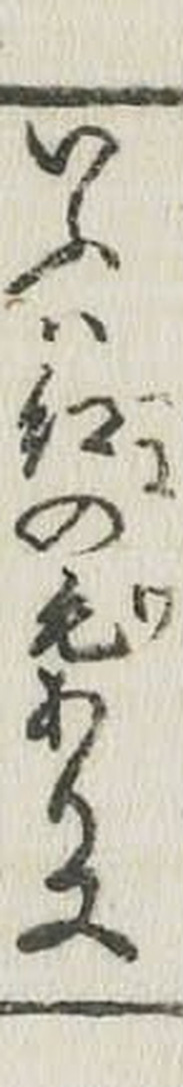いふは紅の毛あり又
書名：増補頭書訓蒙図彙大成 10巻 6:巻之12-13
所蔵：東京学芸大学教育コンテンツアーカイブ
